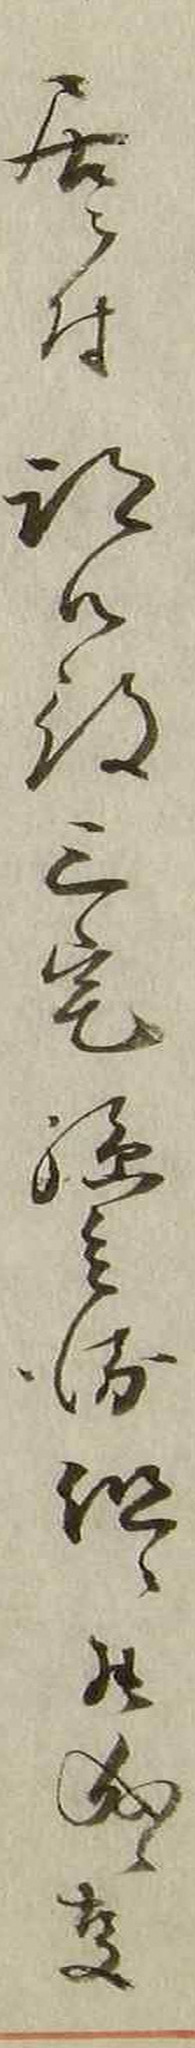居ニ付跡御役三宅孫兵衛組へ罷成候事
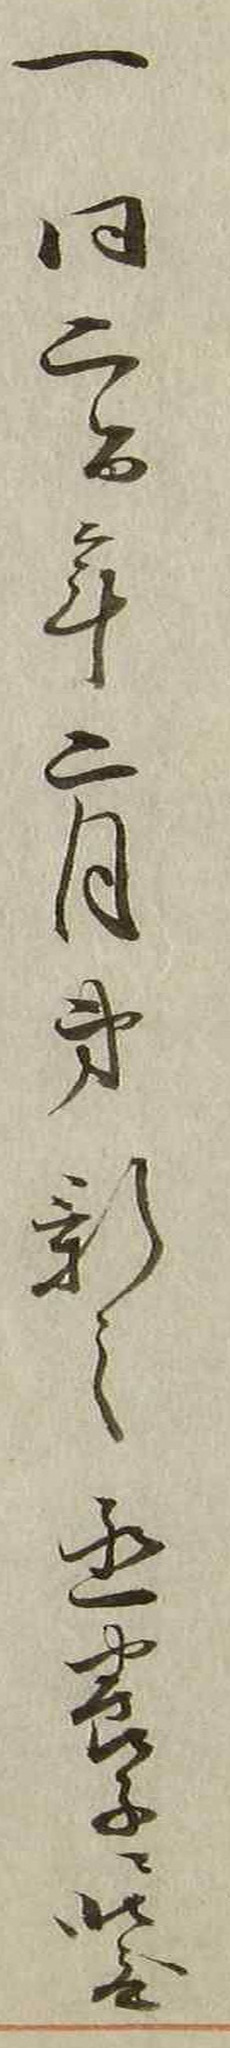一同二酉年二月弟新之丞養子ニ致度
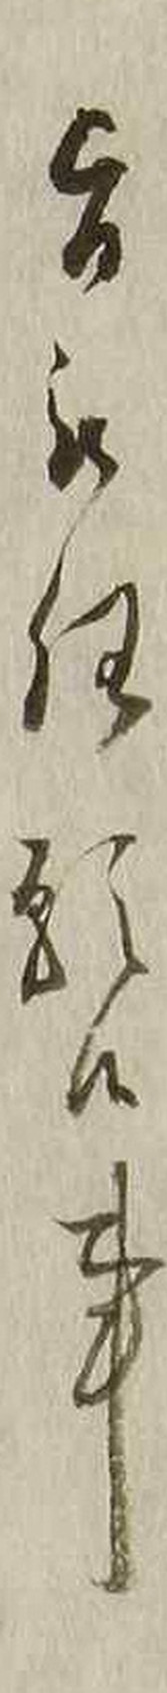旨被任願候事
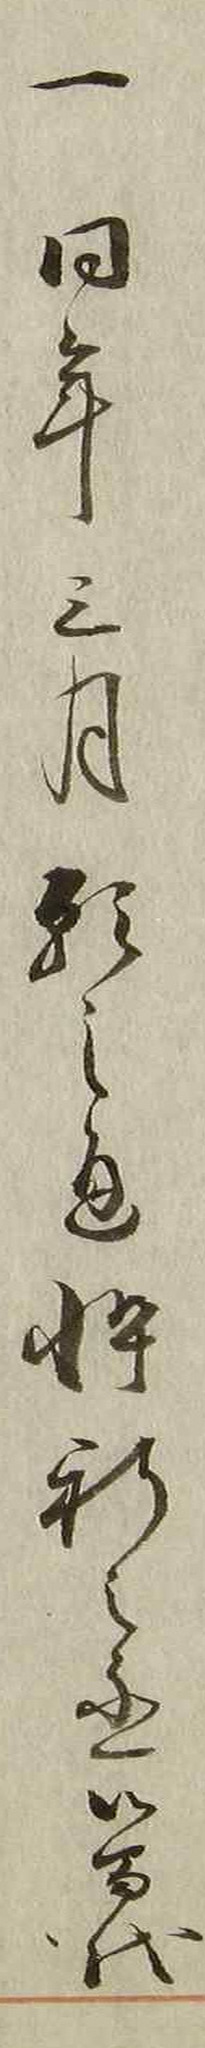一同年三月願之通忰新之丞御番代
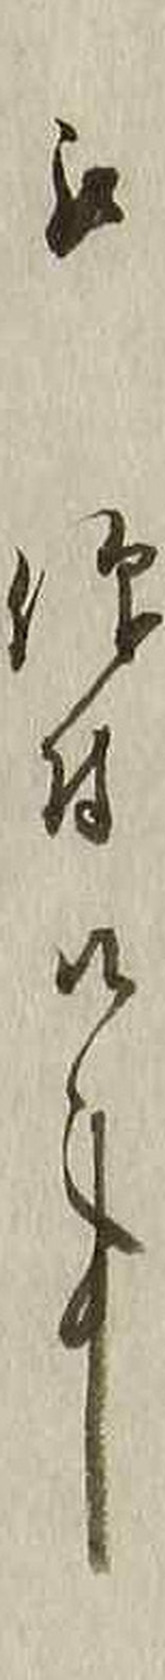被仰付候事
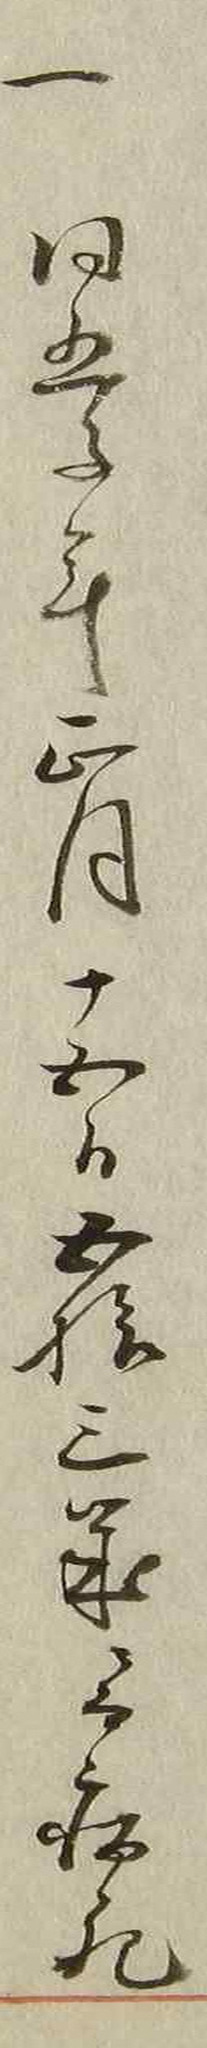一同五子年正月十五日五拾三歳ニ而病死
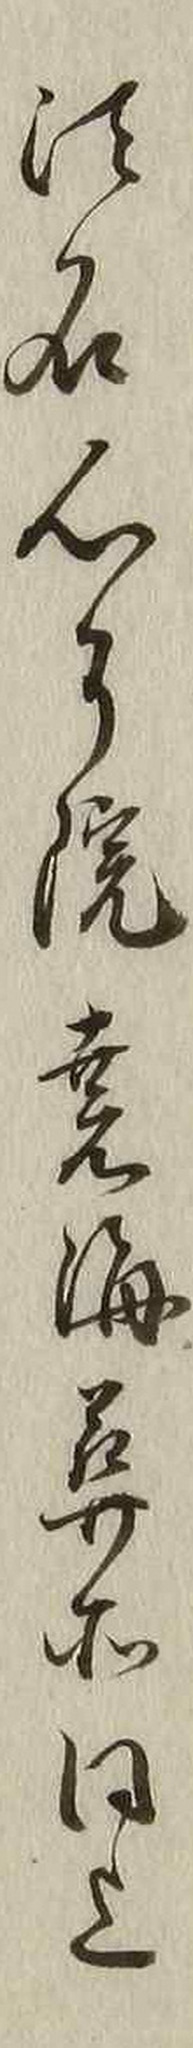法名心了院海葬所同上
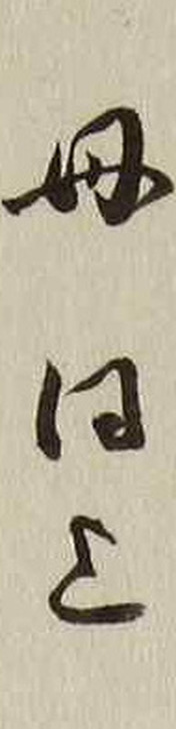母同上
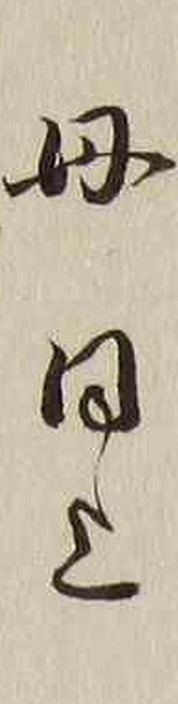母同上
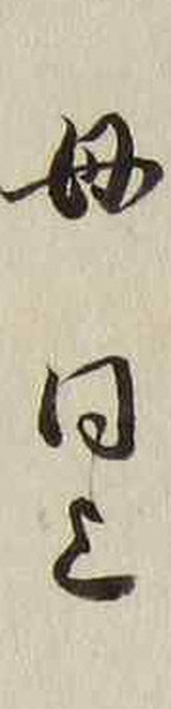母同上
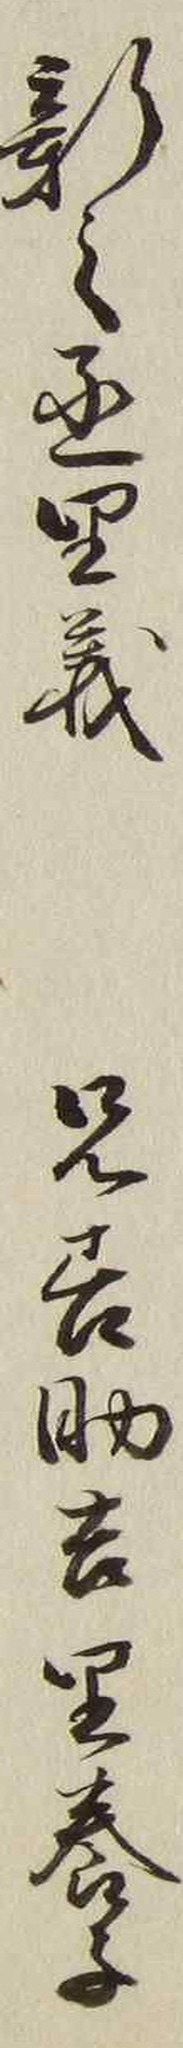新之丞里義兄善助吉里養子

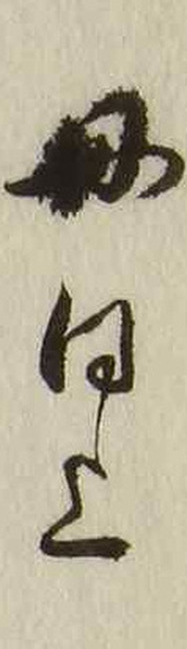母同上
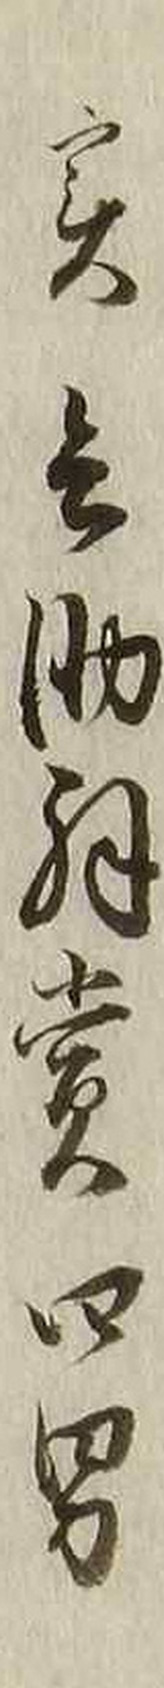実兵助羽賞四男
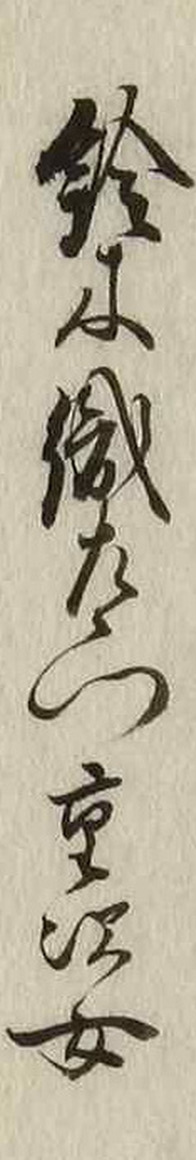鈴木織左衛門重次女
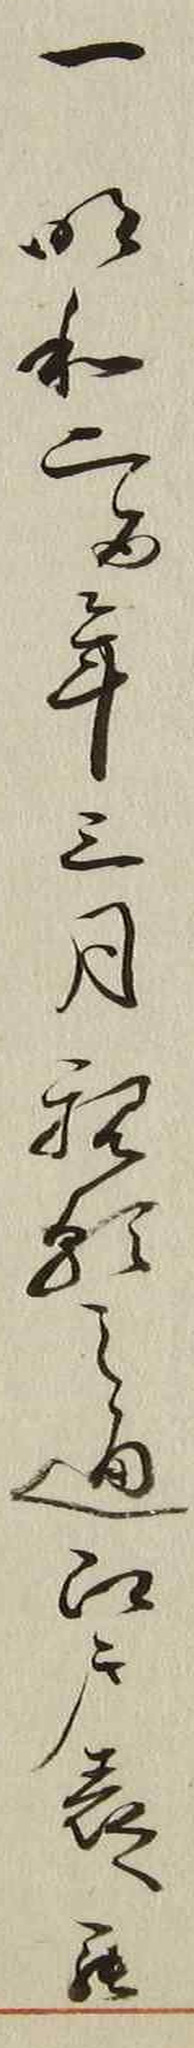一明和二酉年三月親願之通江戸表へ罷
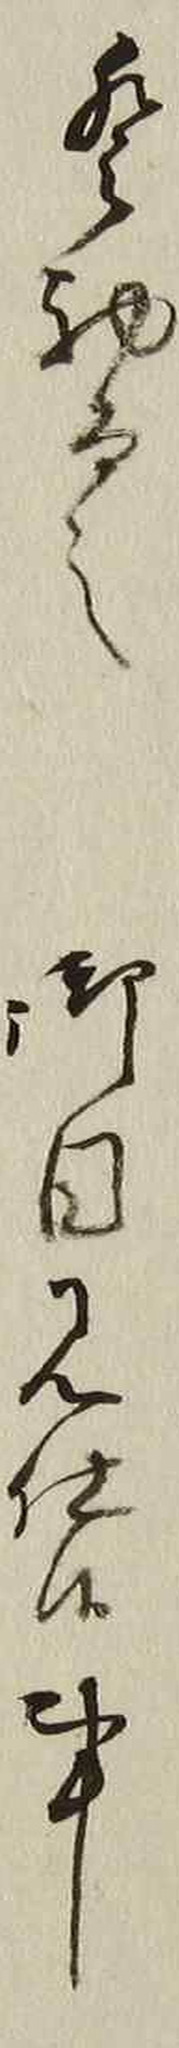登初而之御目見仕候事
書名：諸士系譜　巻之26　い之部26
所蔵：会津若松市立会津図書館
